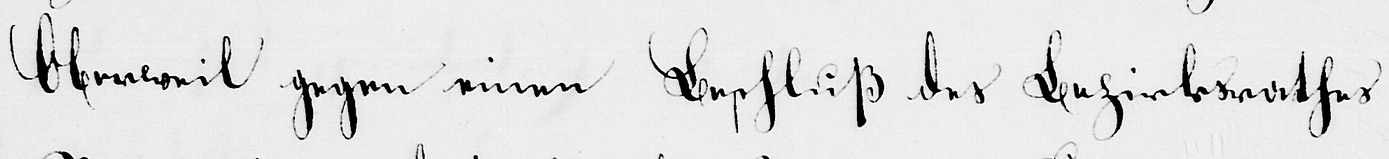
Oberweil gegen einen Beschluß des Bezirksrathes
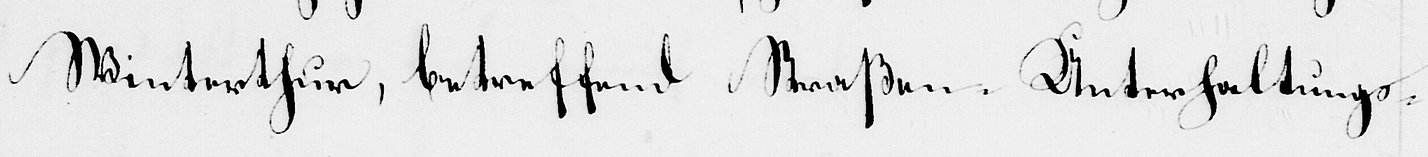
Winterthur, betreffend Straßen-Unterhaltungs¬
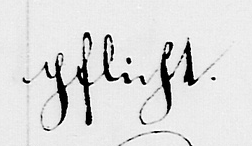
pflicht.
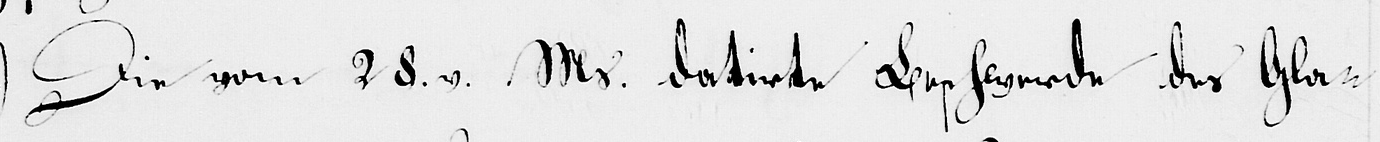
Die vom 28. v. Ms. datirte Beschwerde des Gla¬
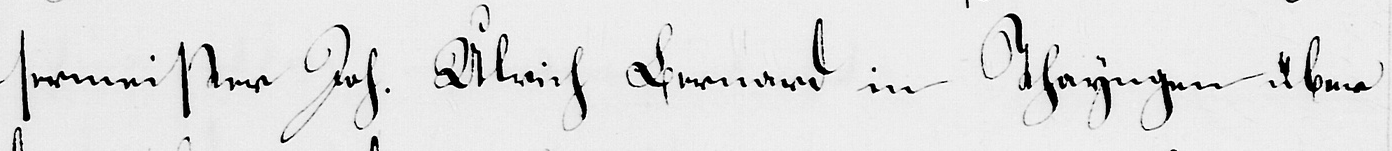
sermeister Joh. Ulrich Bernard in Thayngen über
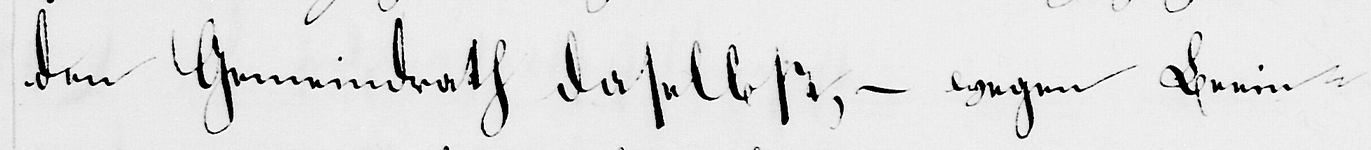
den Gemeindrath daselbst, – wegen Beein¬
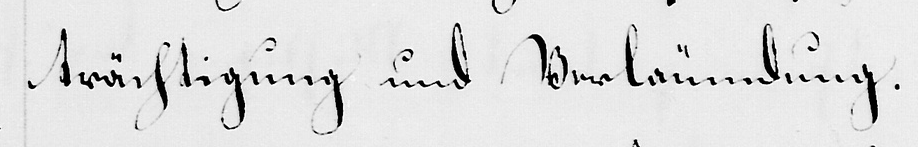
trächtigung und Verläumdung.
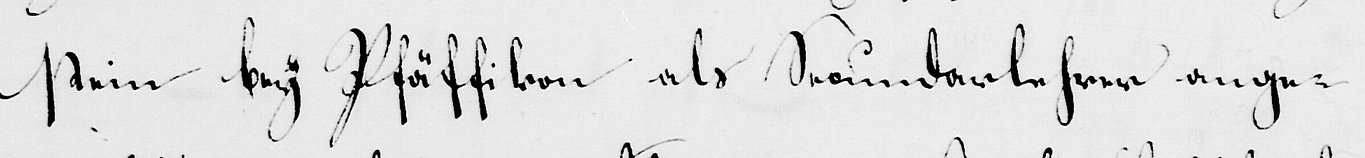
stein bey Pfäffikon als Secundarlehrer ange¬
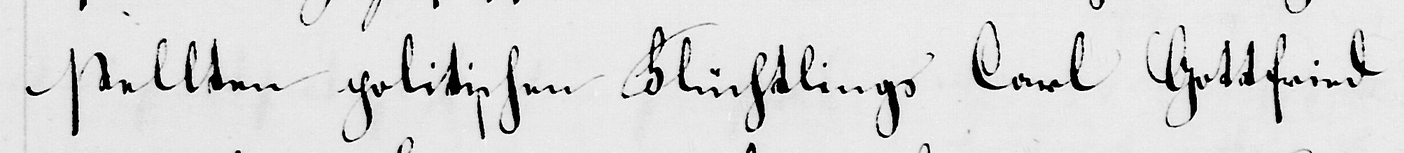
stellten politischen Flüchtlings Carl Gottfried
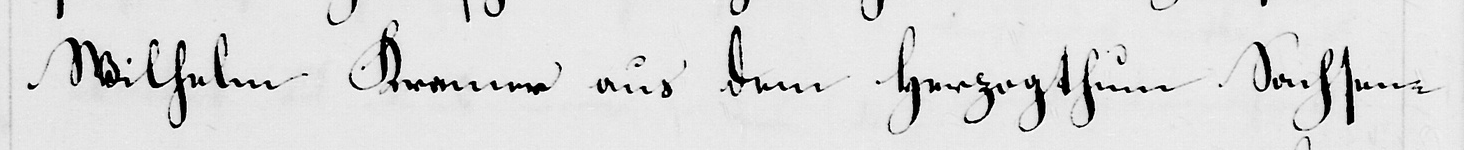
Wilhelm Kramer aus dem Herzogthum Sachsen-
